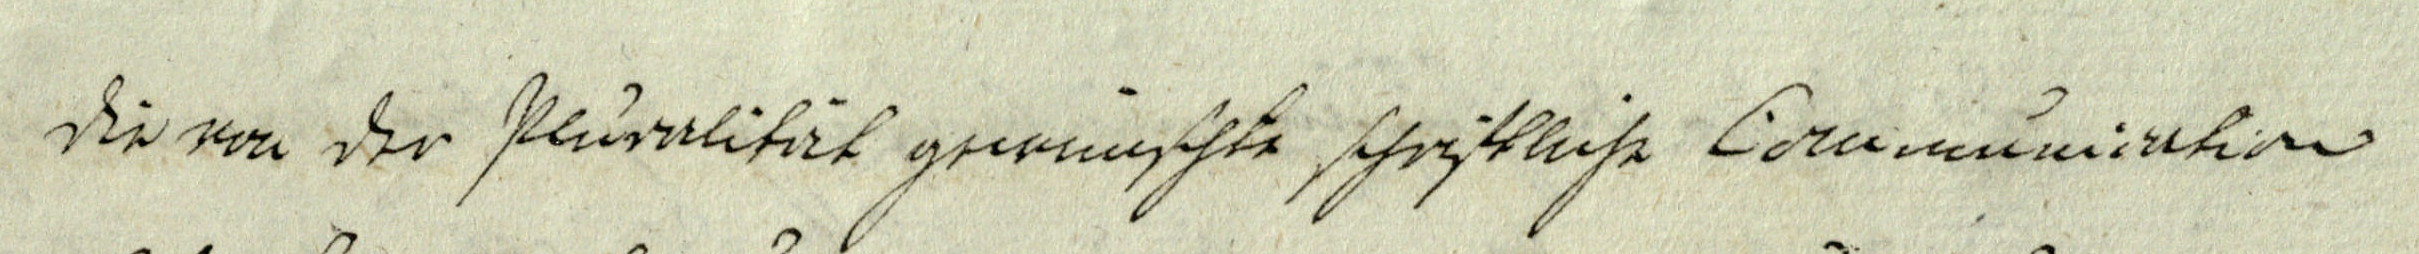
die von der Pluralität gewünschte schriftliche Communication
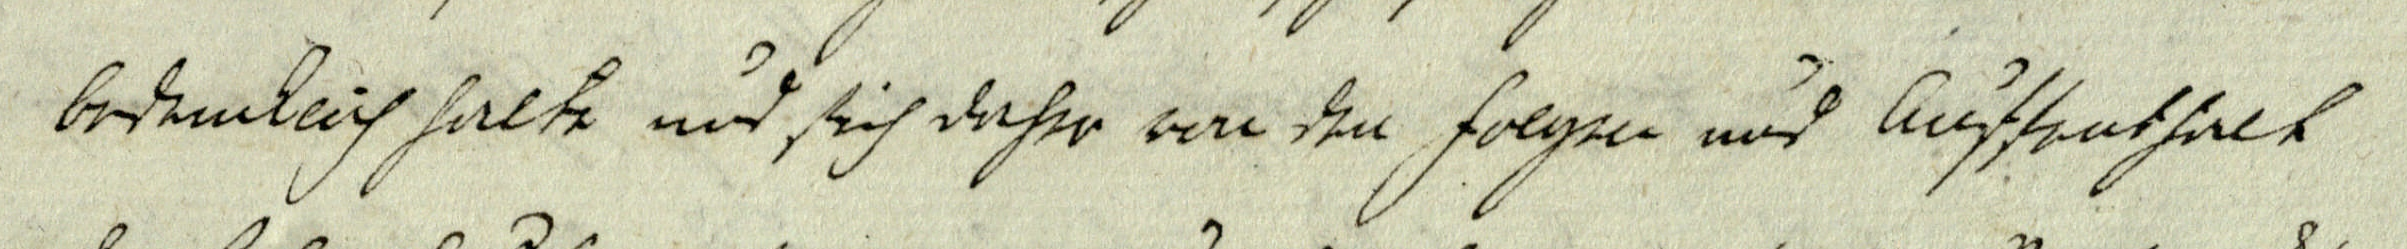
bedenklich halte und sich daher von den Folgen und Auffenthalt
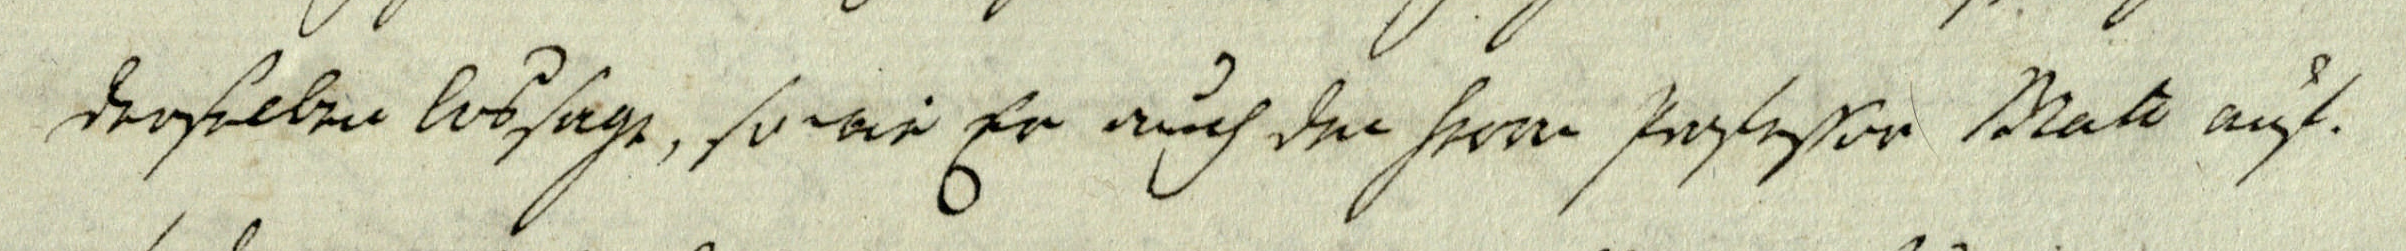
derselben lossage, so wie Er auch den Herrn Professor Bratt auf¬
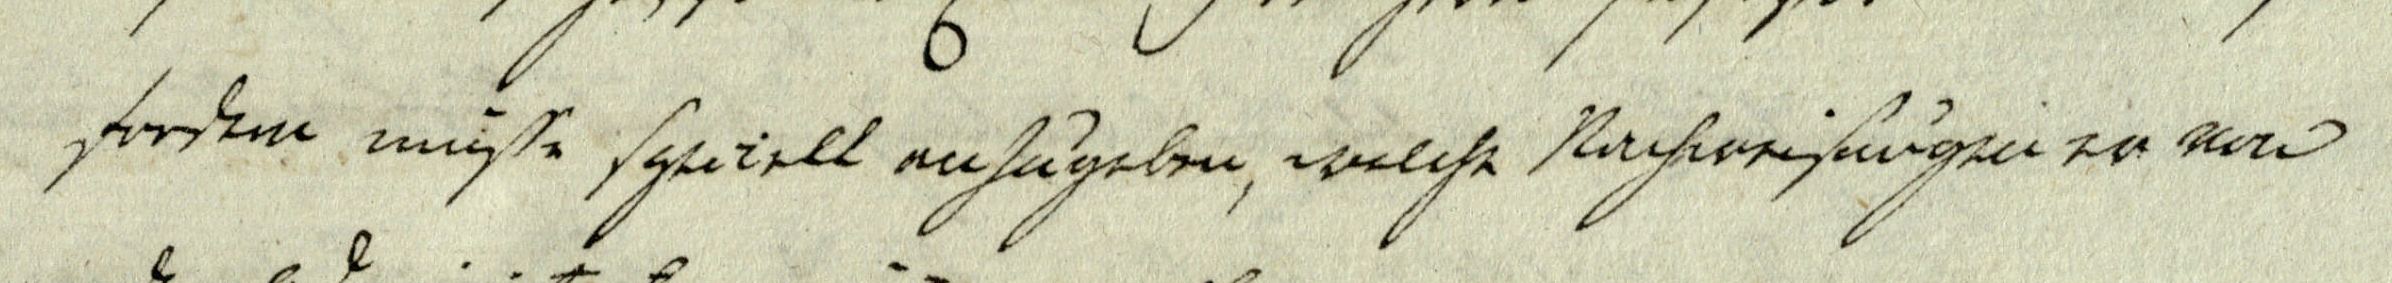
fordern müsse speciell anzugeben, welche Nachweisungen er von
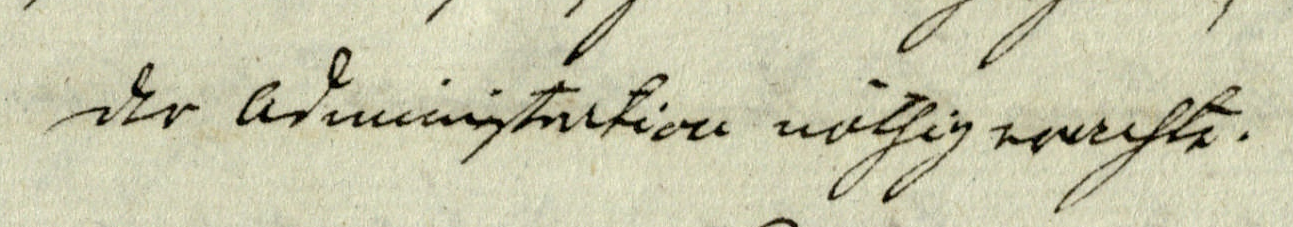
der Administration nöthig erachte.
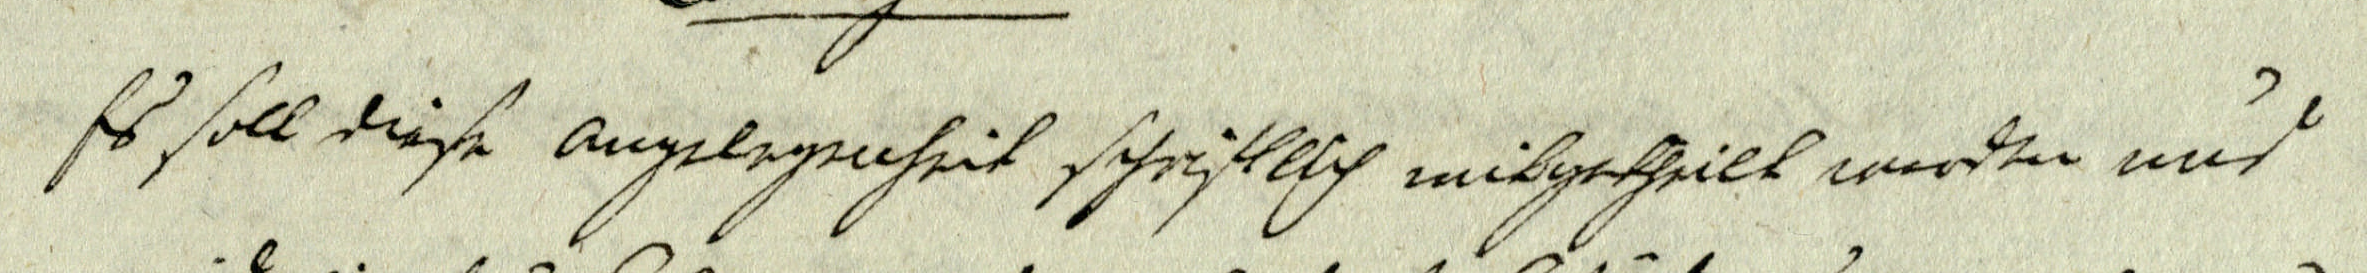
Es soll diese Angelegenheit schriftlich mitgetheilt werden und
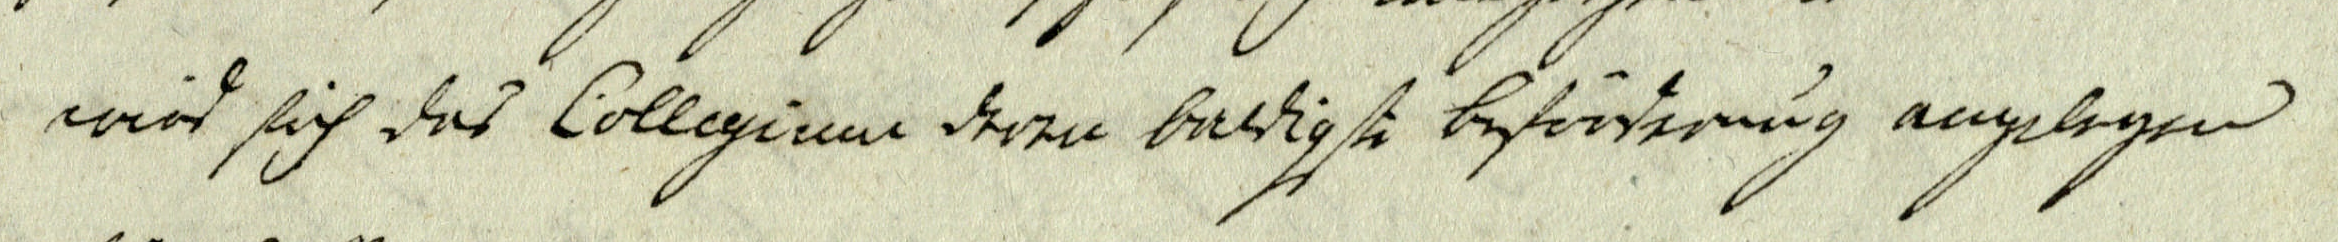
wird sich das Collegium deren baldigste Beförderung angelegen
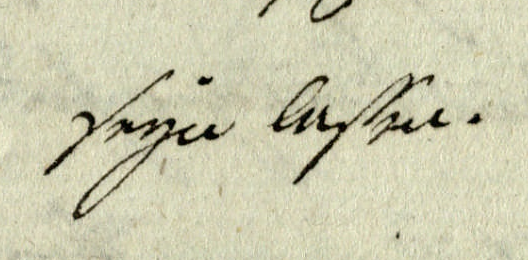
seÿn lassen.
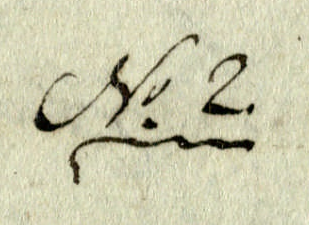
No 2.
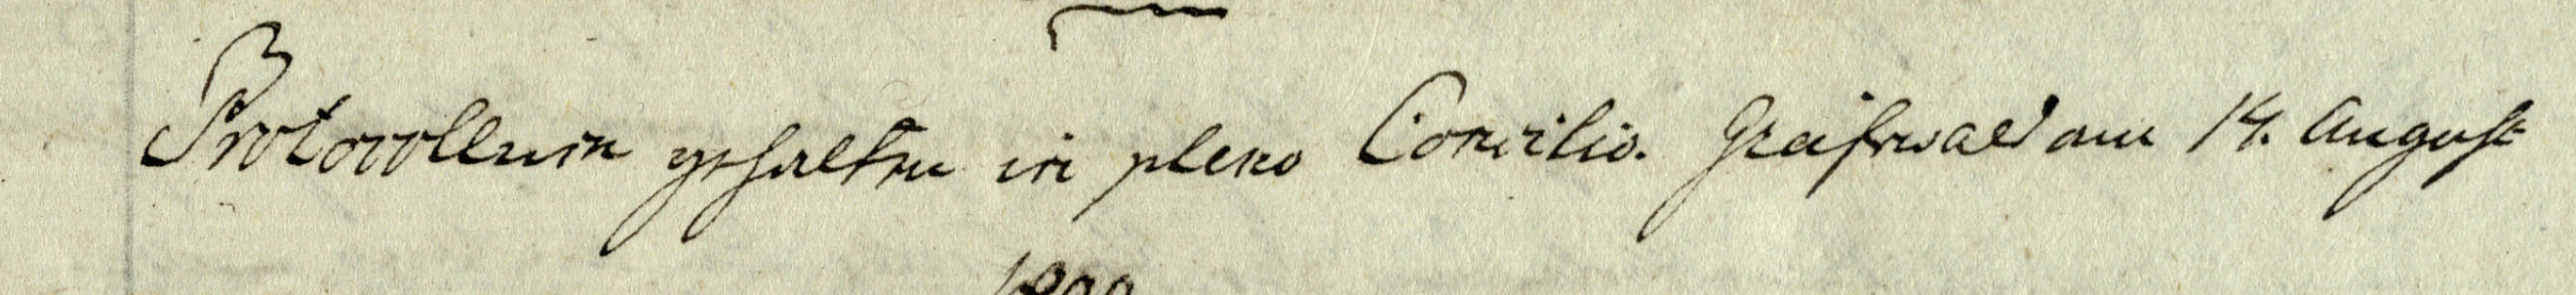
Protocollum gehalten in pleno Concilio. Greifswald am 14. August
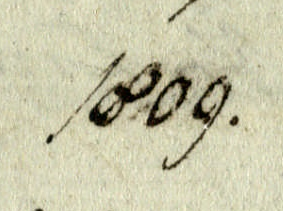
1809.
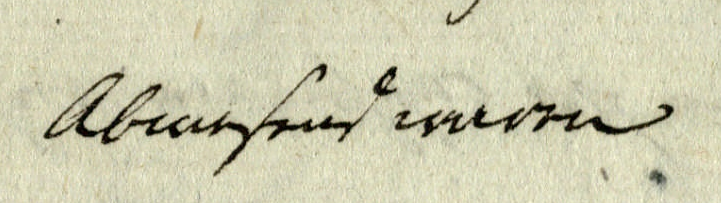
Abwesend waren
